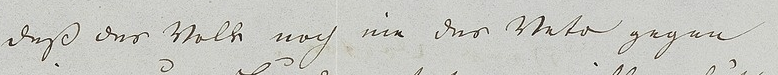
daß das Volk noch nie das Veto gegen
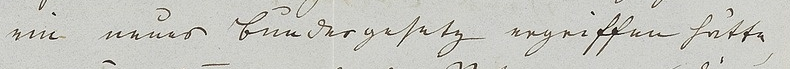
ein neues Bundesgesetz ergriffen hätte,
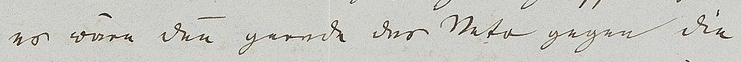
es wäre denn gerade das Veto gegen die
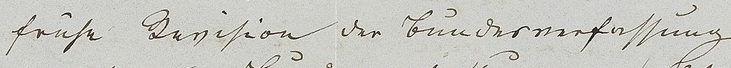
frühe Revision der Bundesverfassung
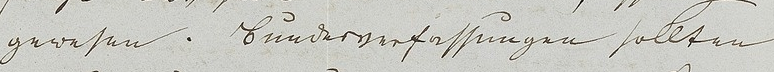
gewesen. Bundesverfassungen sollten
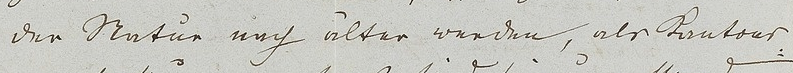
der Natur nach älter werden, als Kantons-
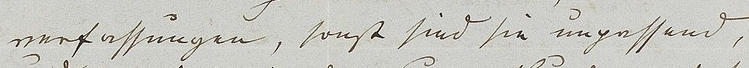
verfassungen, sonst sind sie unpassend,
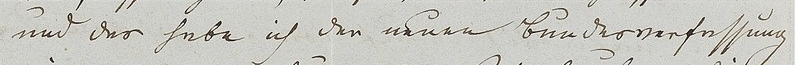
und das habe ich der neuen Bundesverfassung
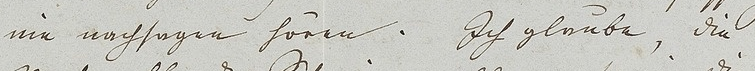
nie nachsagen hören. Ich glaube, die
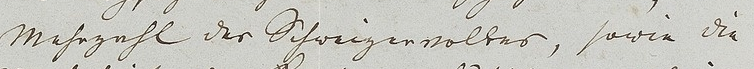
Mehrzahl des Schweizervolkes, sowie die
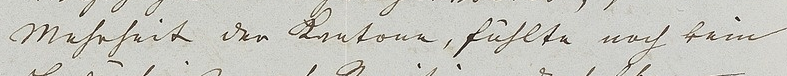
Mehrheit der Kantone, fühlte noch kein
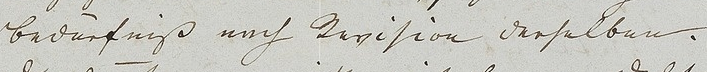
Bedürfniß nach Revision derselben.
